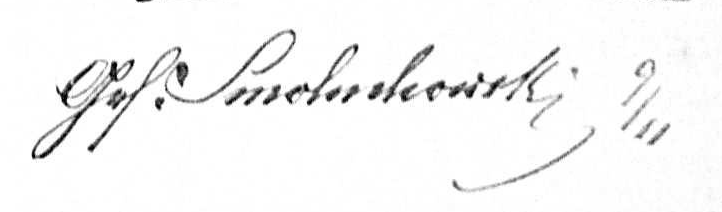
Ges. Smoluchowski 9/11
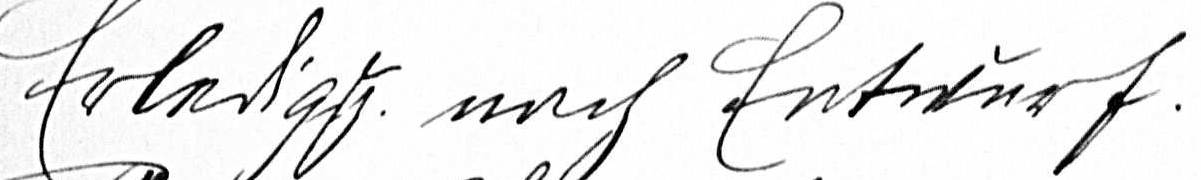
Erledigg, nach Entwurf
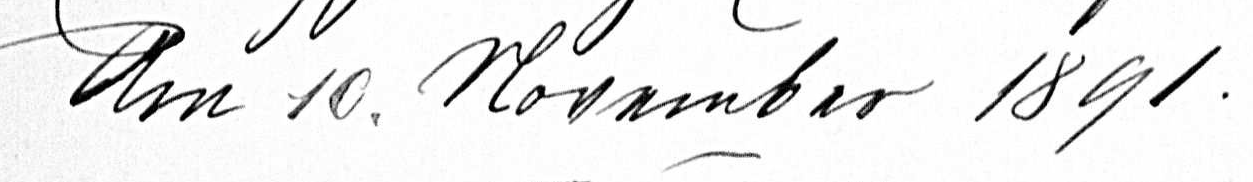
Am 10. November 1891
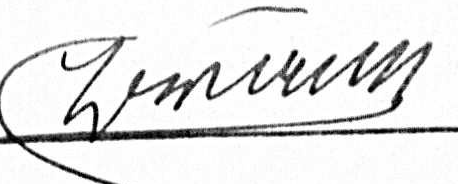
Braun
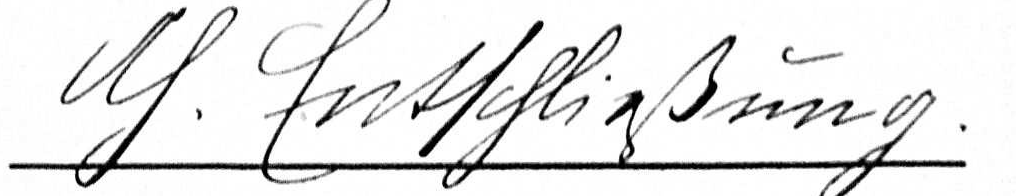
Ah. Entschließung
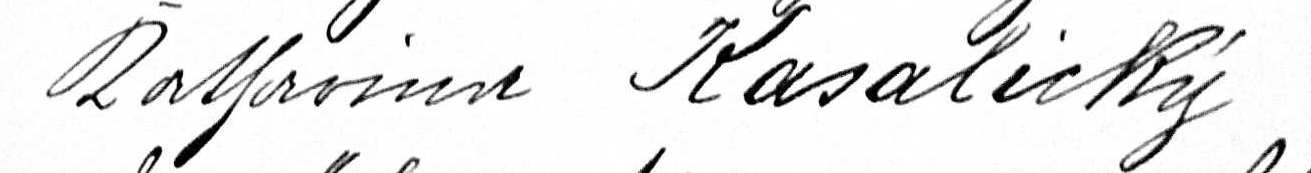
Katharina Kasalický
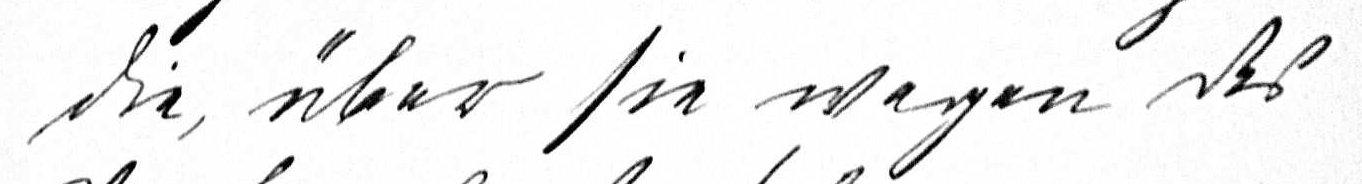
die, über sie wegen des
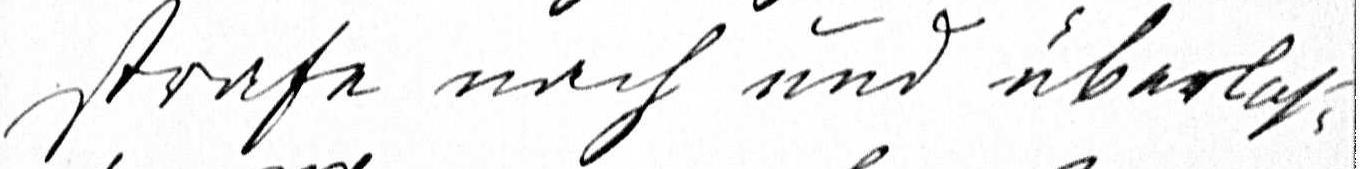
strafe nach und überlas¬
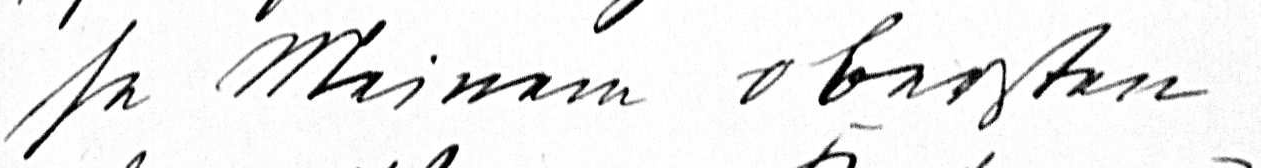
se Meinem obersten
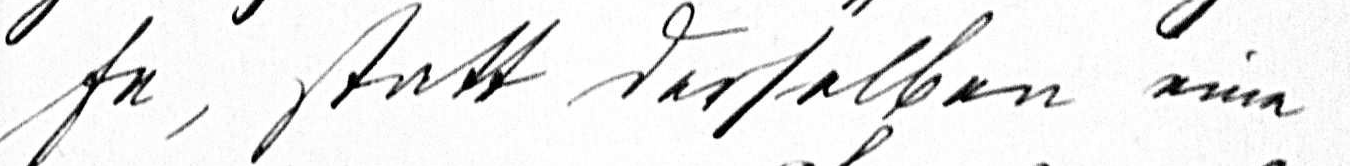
fe, statt derselben eine
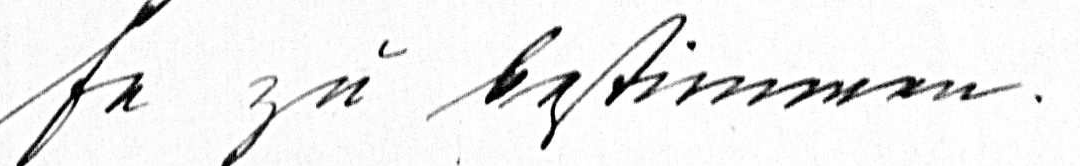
fe zu bestimmen.
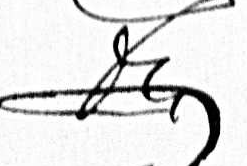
FJ
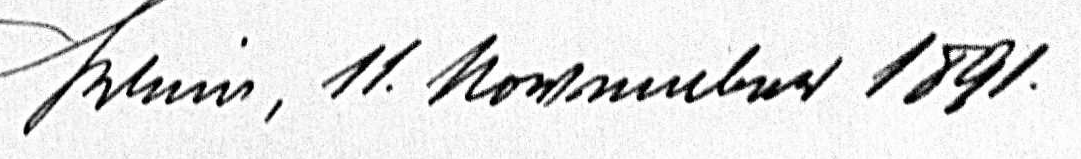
Wien, 11. November 1891
